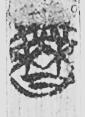{無日}
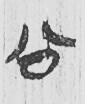公
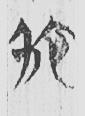{力它}
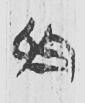於
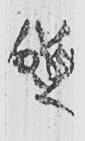頌
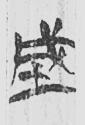城
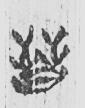晉
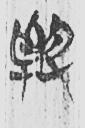與
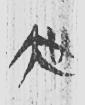吳
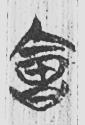會
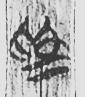爲
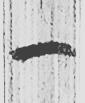一
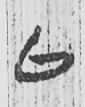㠯（以）
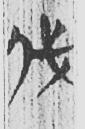伐
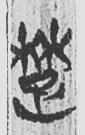楚
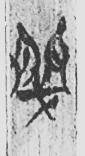{門戈}
